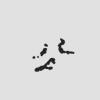公
